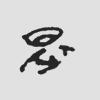是
